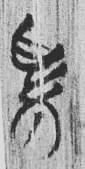○（奚）
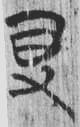○（得）
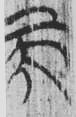而
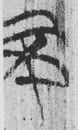不
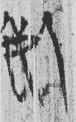死
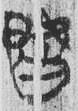既
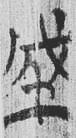城（成）
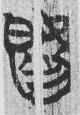既
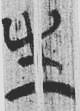生
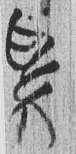○（奚）
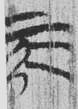而
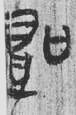鳴
